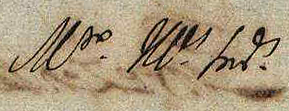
M.to Ill.es Snr.es
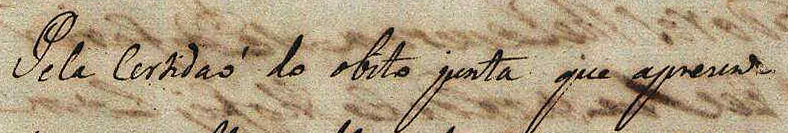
Pela certidaõ do obito junta que apresen
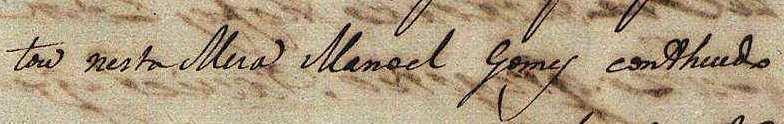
tou nesta Meza Manoel Gomes contheudo
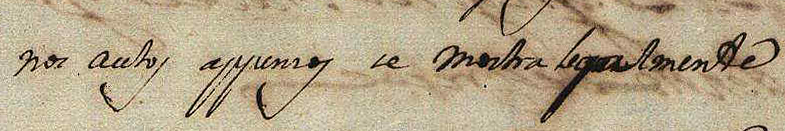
nos autos appensos se mostra legalmente
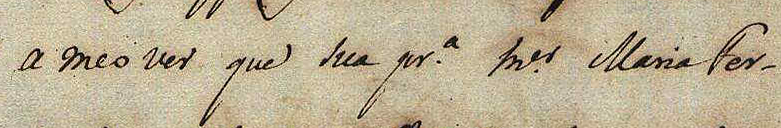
a meo ver que sua pr.a m.er Maria Fer
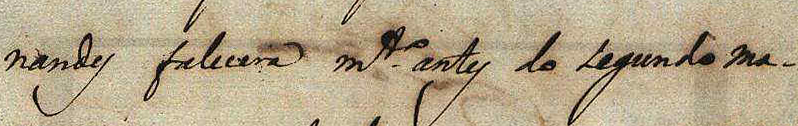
nandes falecera m.to antes do segundo ma
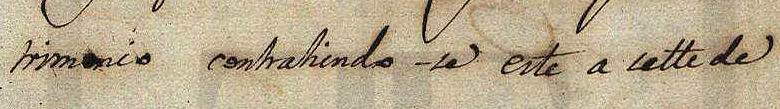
trimonio, contrahindo-se este a sette de
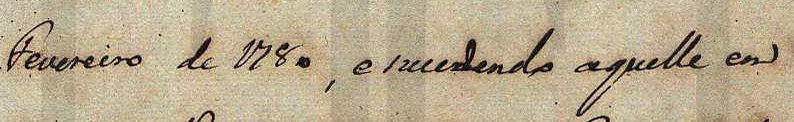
Fevereiro de 1780, e sucedendo aquelle em
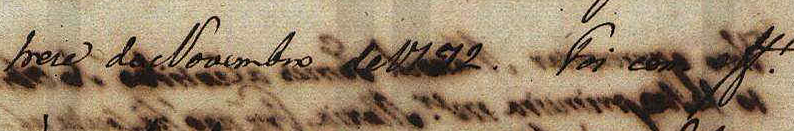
treze de Novembro de 1772. Foi com eff.o
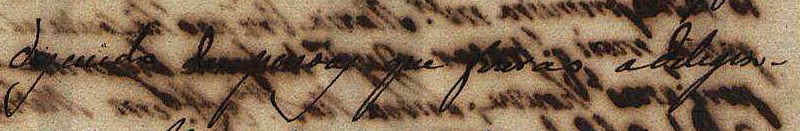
descuido das pessoas que fizeraõ a deligen
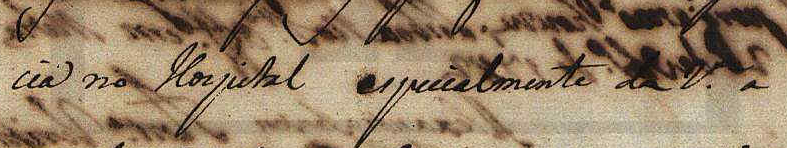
cia no Hospital especilmente da V.a a
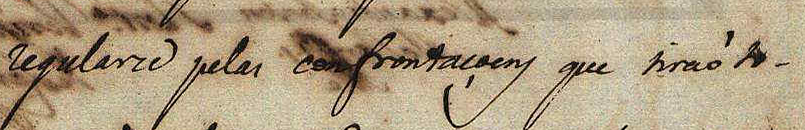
Regularce pelas confrontaçoens que tiraõ to
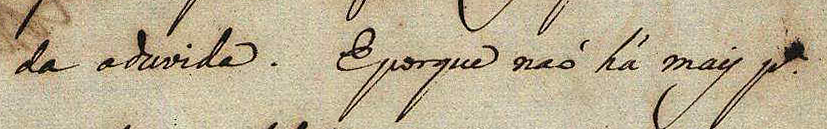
da a duvida. E porque naõ há mais p.a
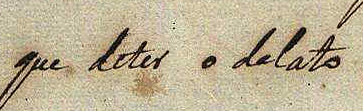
que deter o delato
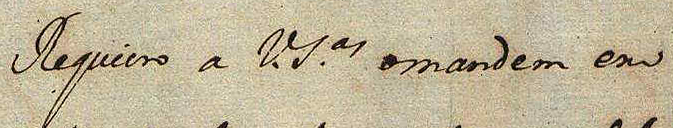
Requeiro a V.S.as o mandem em
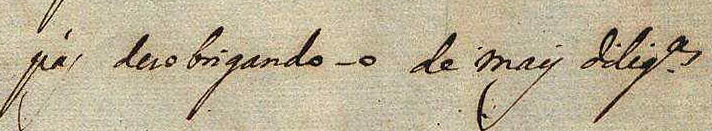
pás desobrigando-o de mais dilig.as
